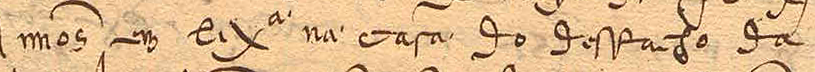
Annōs em lixa na casa do despacho da
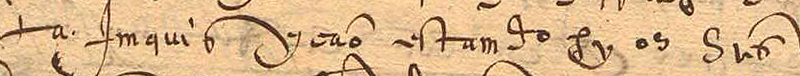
Sta Jmquisyçaõ estamdo hy os Sr̄es
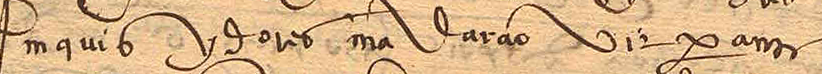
Jmquisydores mādarão vir ꝑante
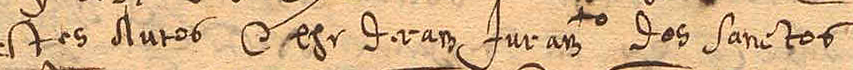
estes Autos e lhe deram Juramto dos Sanctos
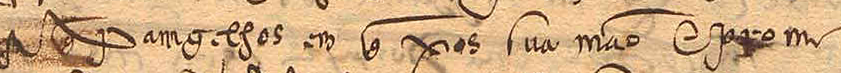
Avamgelhos em q̄ pos sua mão e prome
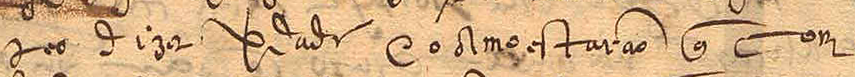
teo dizer ꝟdade e o Amoestarão q̄ com
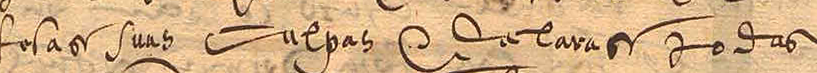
fesase suas Culpas e declarase todas
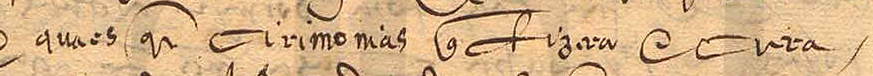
e quaesq̄r cirimonias q̄ fizera e Crera/
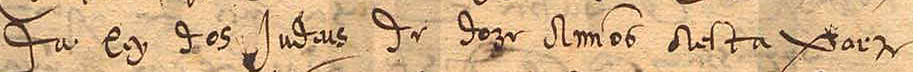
da ley dos Judeus de doze Annōs A esta parte
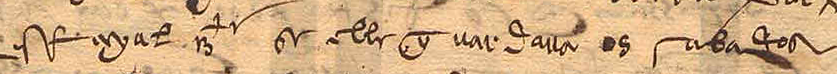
especyalmte se elle guardaua os sabados
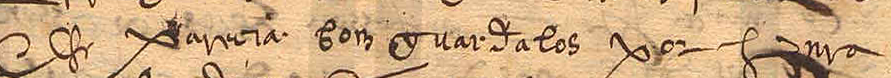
e lhe parecia bom guardalos por honra
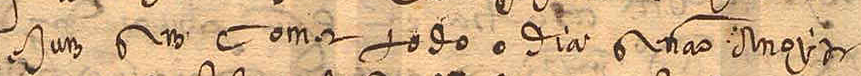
JeJum sem comer todo o dia senão A noyte
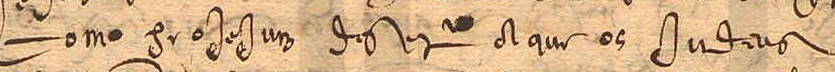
Como he o JeJum de setro A que os Judeus
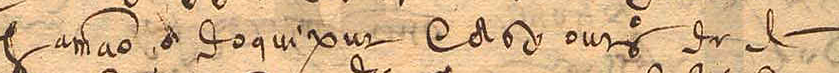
chamão do quipur e Asy outros de de
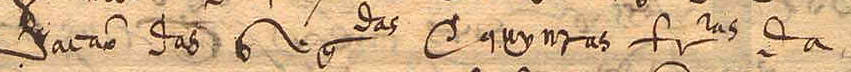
vaçaõ das segdas e quyntas feras da
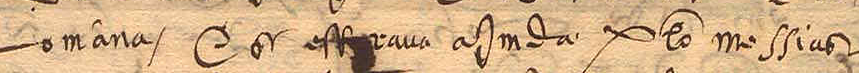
somana / e se esperaua aJmda pl̄o messias
